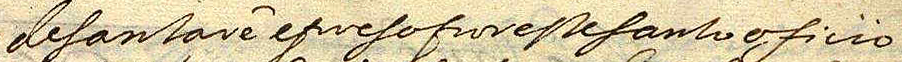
de santarē e preso por este santo oficio
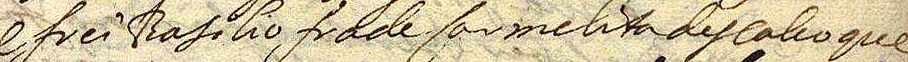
e frei Basilio frade Carmelita descalco que
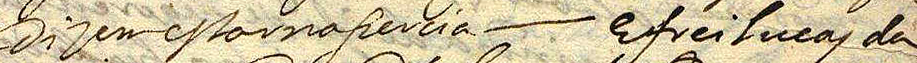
dizem estar na percia - E frei lucas da
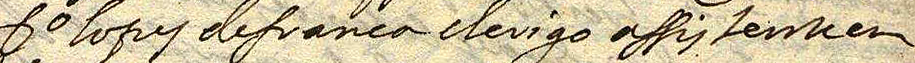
Do lopes de franca clerigo assistente em
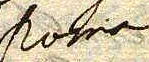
Roma
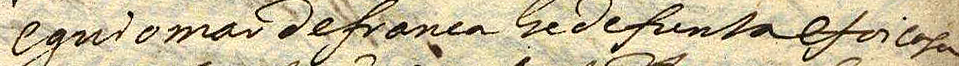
e guiomar de franca he defunta e foi casa
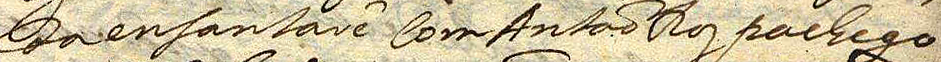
da en santarē Com Antaõ Roz pacheco
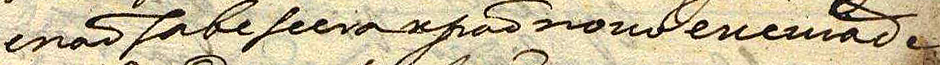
e naõ sabe se era xpaõ nouo e ueuia de
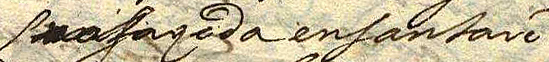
sua fazēda en santarē
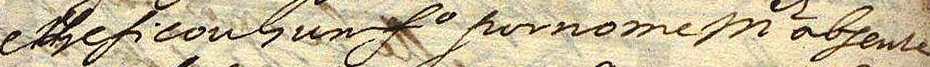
e lhe ficou hum fo por nome mel absente
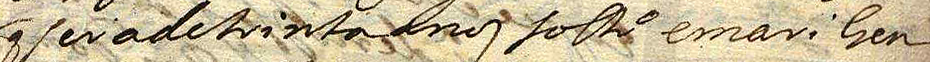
q̄ seria de trinta anos soltro e marihen
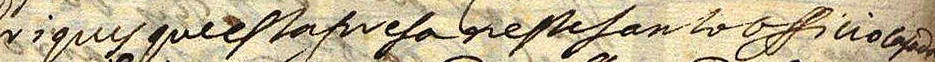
riques que esta presa neste santo officio casada
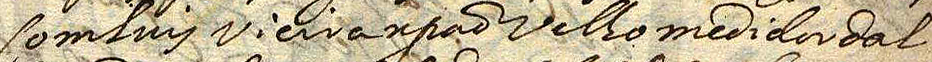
Com luis vieira xpaõ velho medidor dal
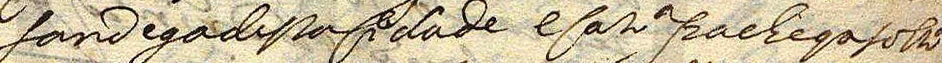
fandega dessa Cidade e Catra pacheqa, soltra
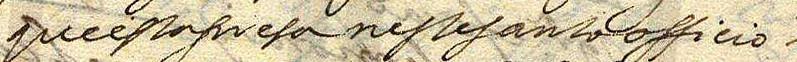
que esta presa neste santo officio
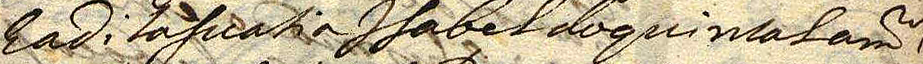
E a dita sua tia Jsabel do quintal a mtos
